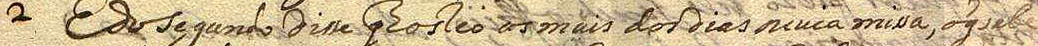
2 E do segundo disse q̄ o Reo os mais dos dias ouuia missa, o q̄ sabe
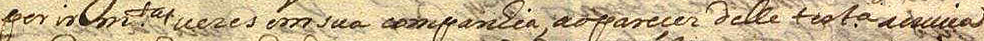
por ir m.tas uezes em sua companhia, ao pareçer delle test.a a ouuia
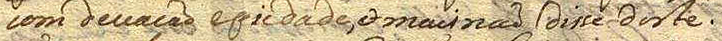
com deuoçaõ e piedade, & mais naõ disse deste.
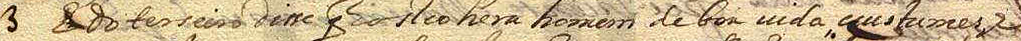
3 E do terceiro disse q̄ o Reo hera homem de boa uida, e custumes, E
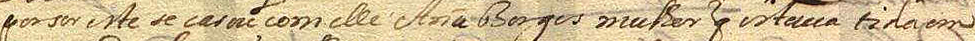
por ser este se casou com elle Ana Borges mulher q̄ estaua tida em
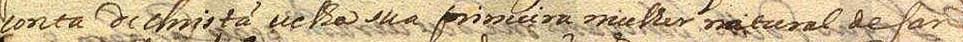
conta de christã uelha sua primeira mulher natural de san
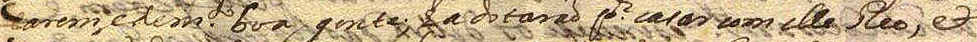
tarem, e de m.to boa gente; E a dotaraõ p.a casar com elle Reo, &
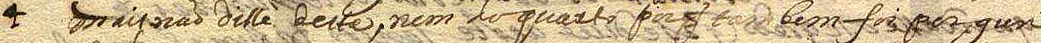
4 mais naõ disse desta, nem ao quarto porq̄ tambem foi pergun
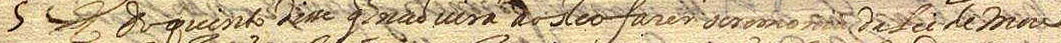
5 E do quinto disse q̄ naõ uira do Reo fazer seremonia da lei de mou
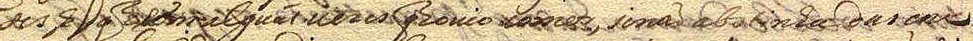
ses, E q̄ em alguās uezes q̄ o uio comer, se naõ abstinha das cou
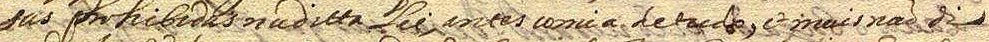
sas prohibidas na ditta Lei, antes comia de tudo, & mais naõ di
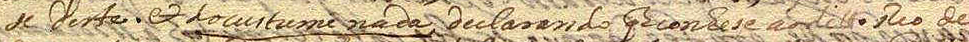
se deste. & do custume nada, declarando q̄ conhese ao ditto Reo des
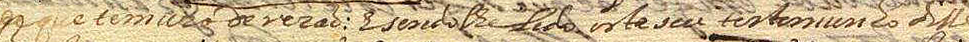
de que tem uzo de rezaõ: E sendolhe lido este seu testemunho disse
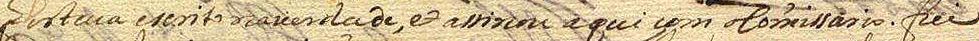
q̄ estaua escrito na uerdade, & assinou aqui com o Com̄issario. frei
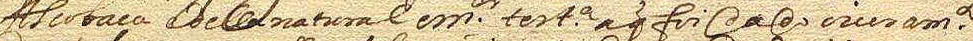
Alcobaça e delle natural e m.or test.a a q̄ foi dado o iuram.to
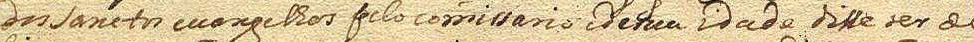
dos sanctos euangelhos pelo com̄issario e de sua idade disse ser de
